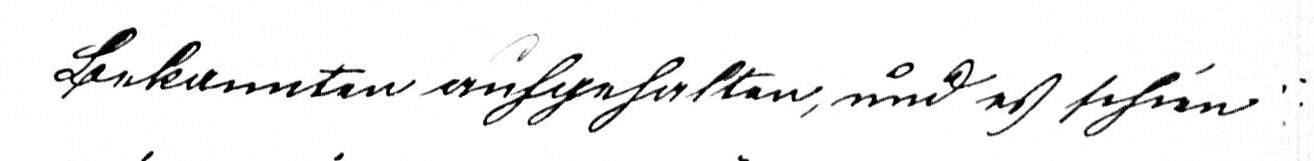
Bekannten aufgehalten, und es schien
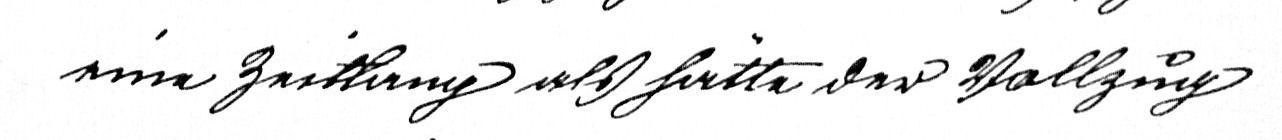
eine Zeitlang als hätte des Vollzug
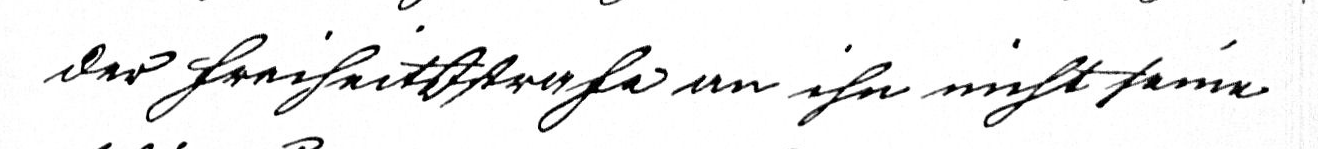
der Freiheitsstrafe an ihn nicht seine
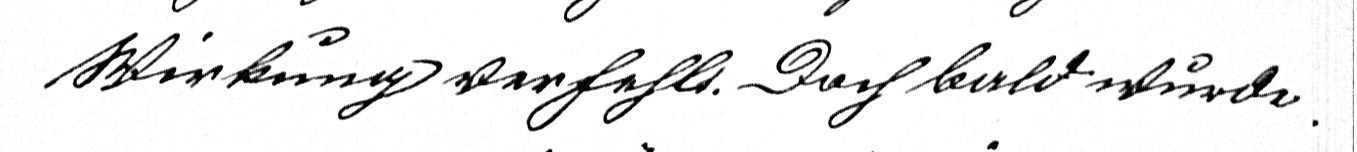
Wirkung verfehlt. Doch bald wurde
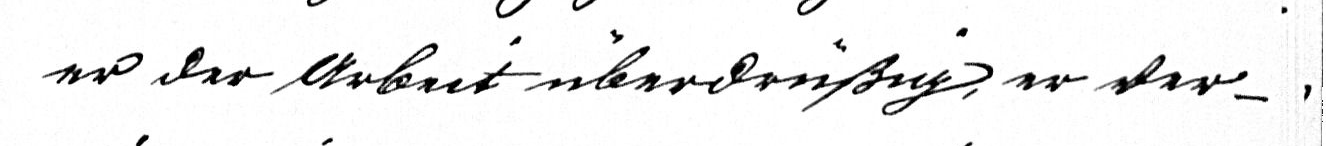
er der Arbeit überdrüßig, er ver¬
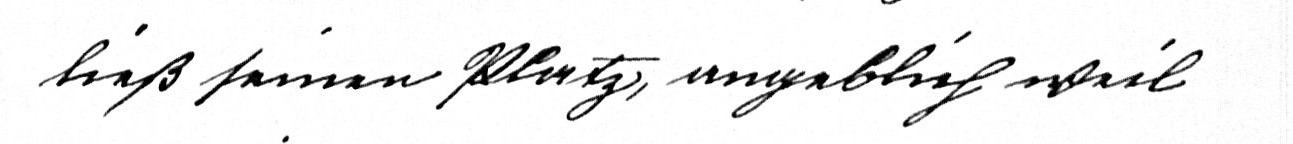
ließ seinen Platz, angeblich weil
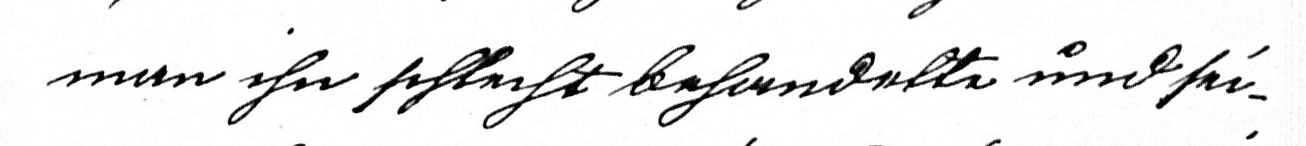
man ihn schlecht behandelte und sei¬
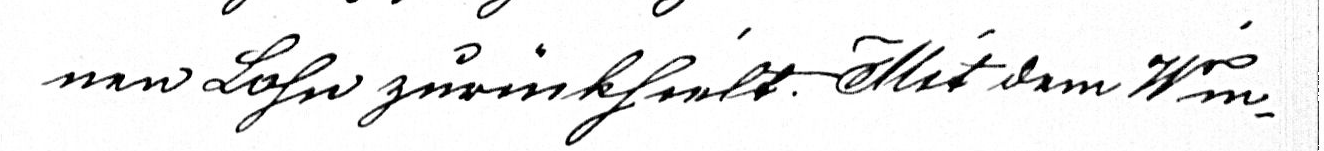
nen Lohn zurückhielt. Mit dem Win¬
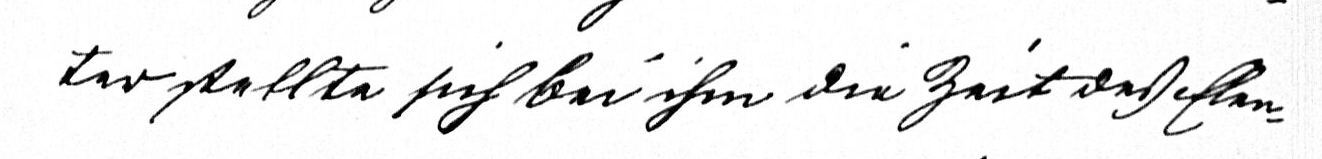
ter stellte sich bei ihm die Zeit des Elen
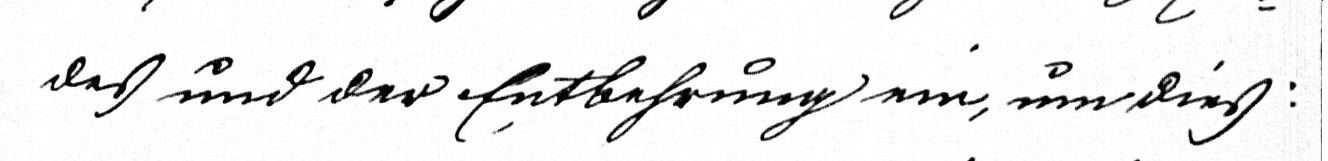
des und der Entbehrung ein, um dies
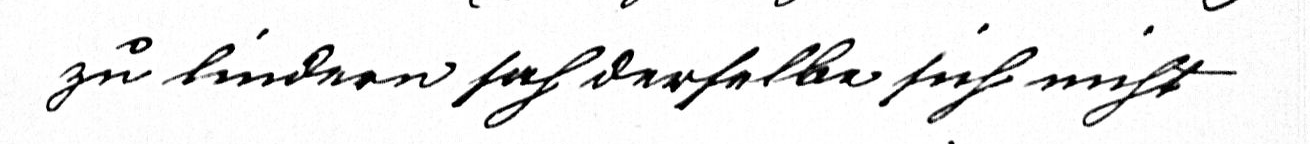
zu lindern sah derselbe sich nicht
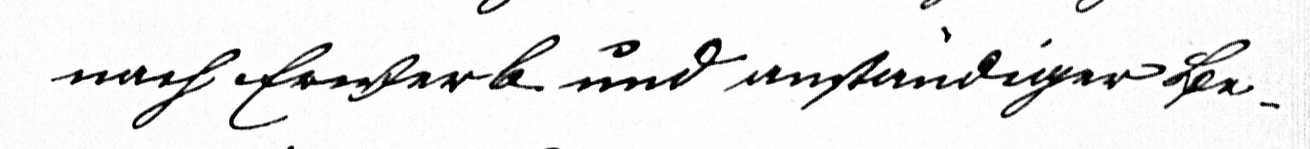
nach Erwerb und anständiger Be¬
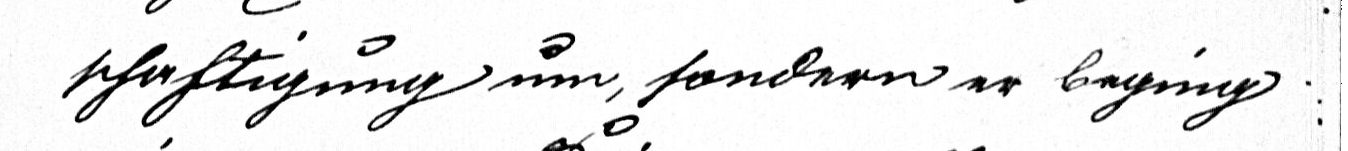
schaftigung um, sondern er beging
